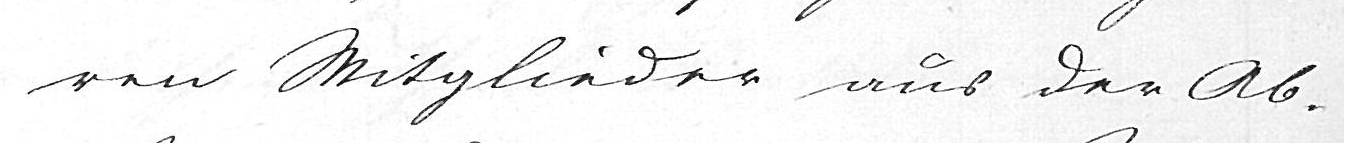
ren Mitglieder aus der Ab-
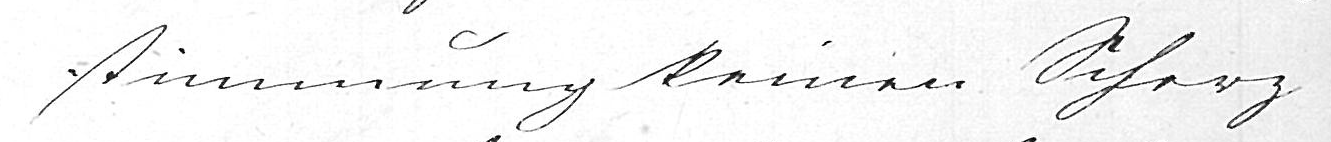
stimmung keinen Scherz
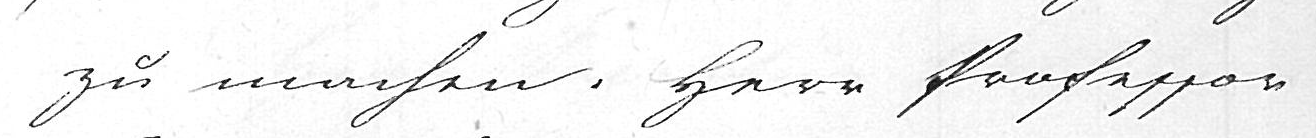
zu machen. Herr Professor
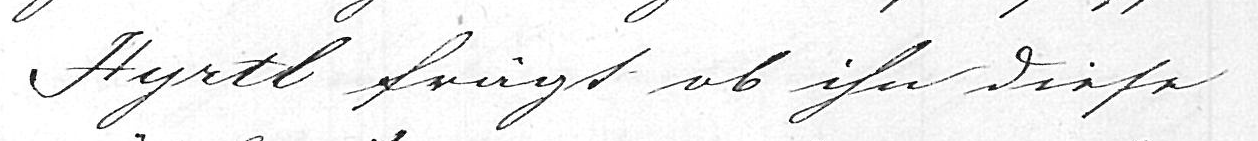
Hyrtl frägt, ob ihn diese
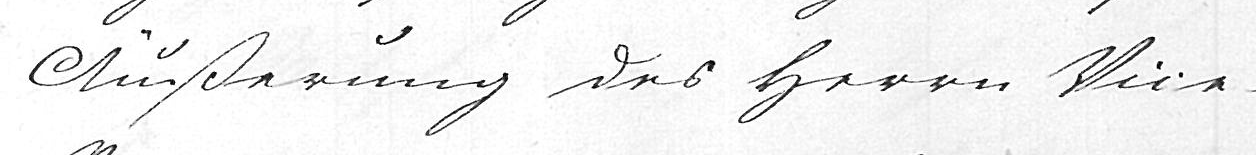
Äußerung des Herrn Vice-
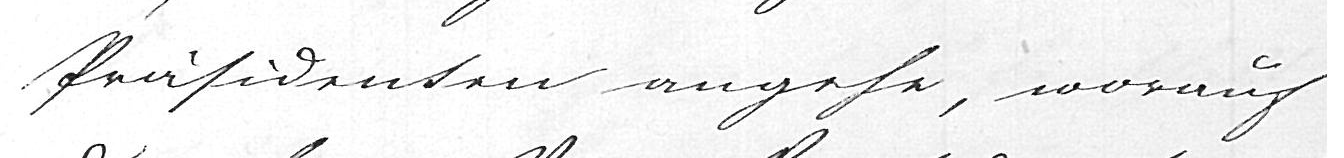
Präsidenten angehe, worauf
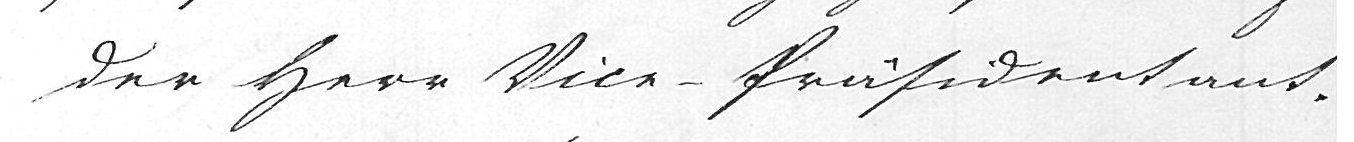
der Herr Vice-Präsident ant-
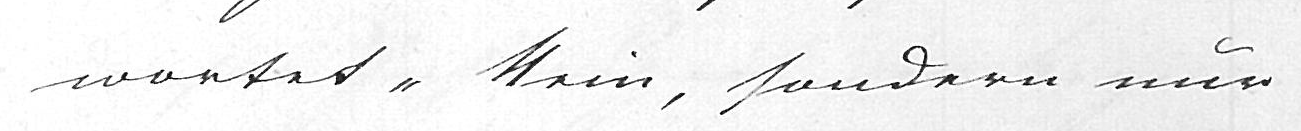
wortet "Nein, sondern nur
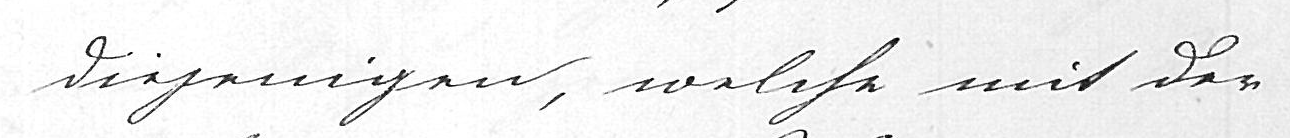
diejenigen, welche mit der
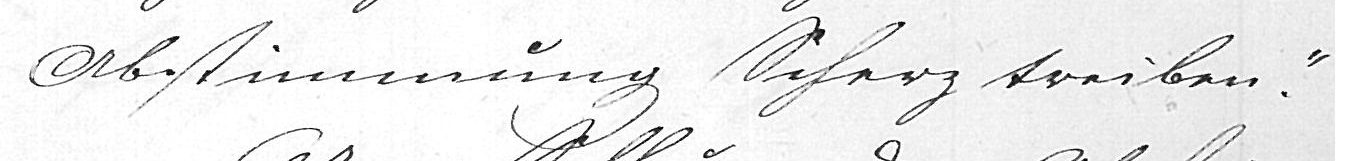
Abstimmung Scherz treiben."
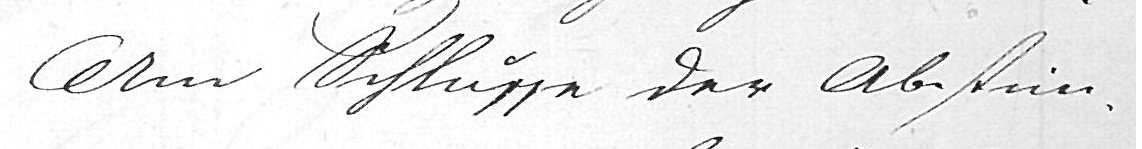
An Schlusse der Abstim-
